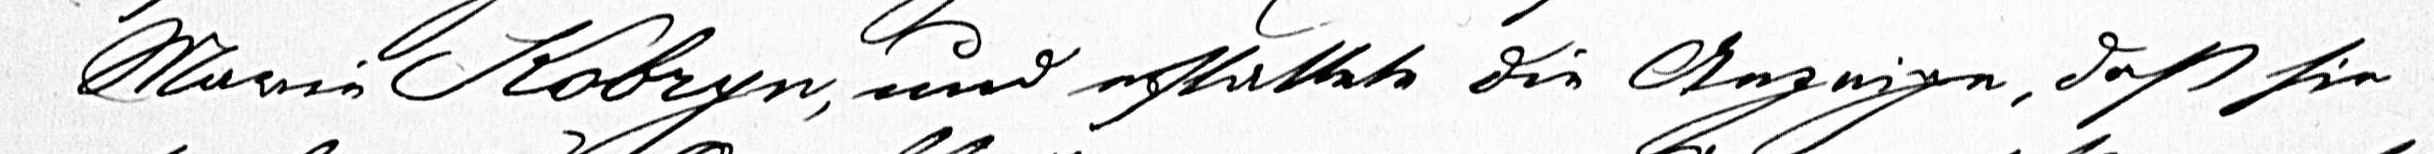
Marie Kobryn, und erstatte die Anzeige, daß sie
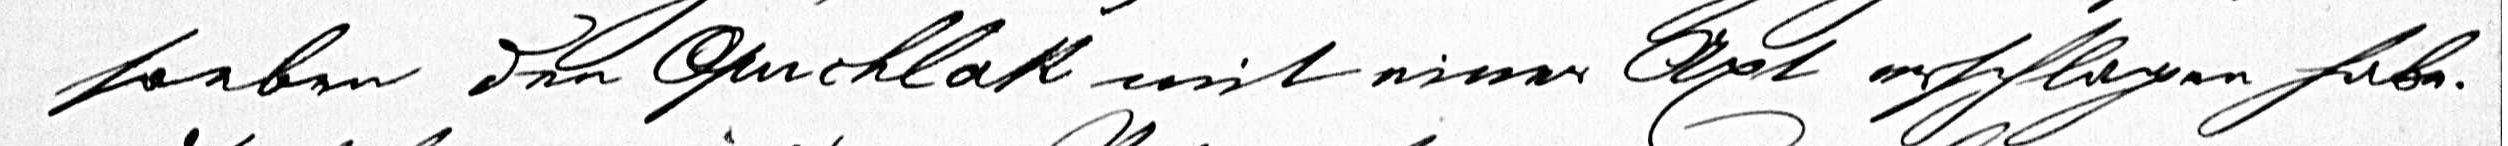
soeben den Opuchlak mit einer Axt erschlagen habe.
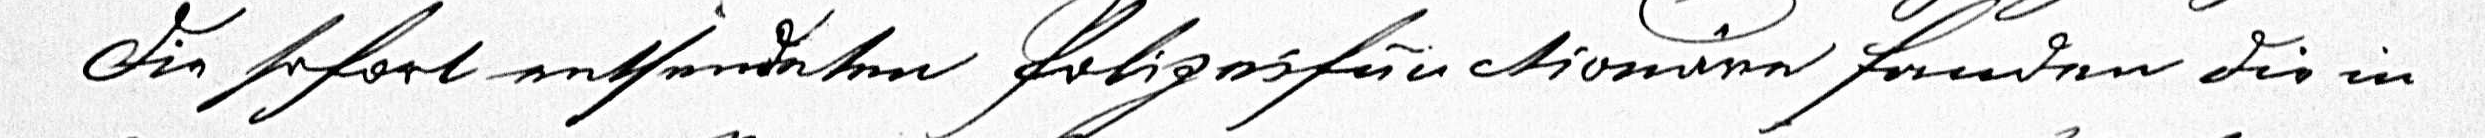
Die sofort entsendeten Polizeifunctionäre fanden die in
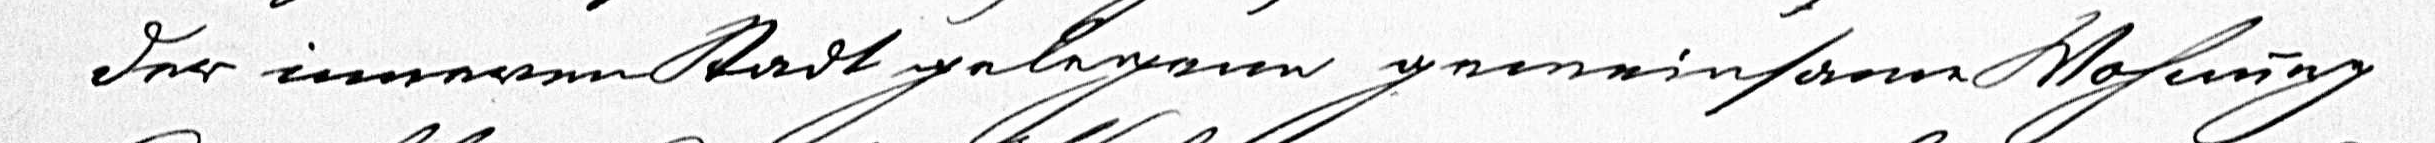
der inneren Stadt gelegene gemeinsame Wohnung
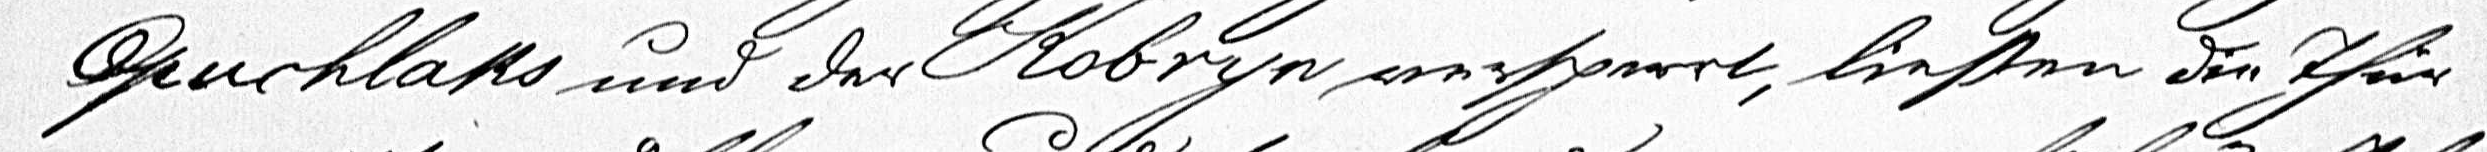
Opuchlaks und der Kobryn versperrt, ließen die Thür
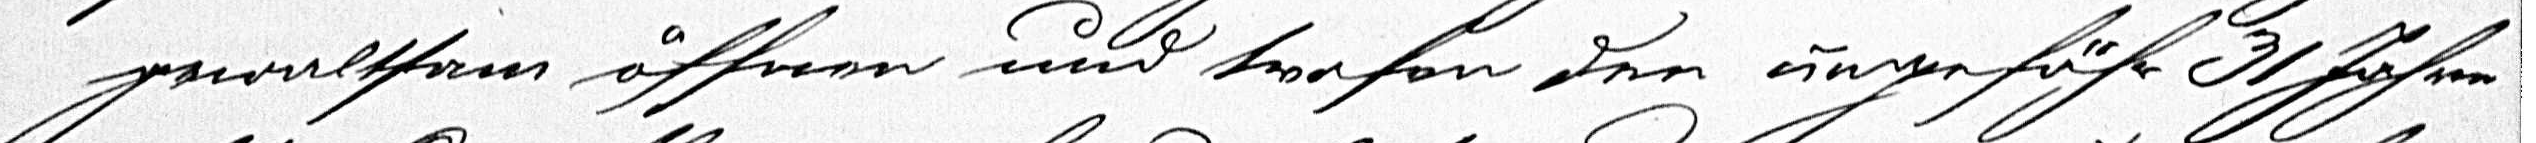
gewaltsam öffnen und trafen den ungefähr 31 Jahre
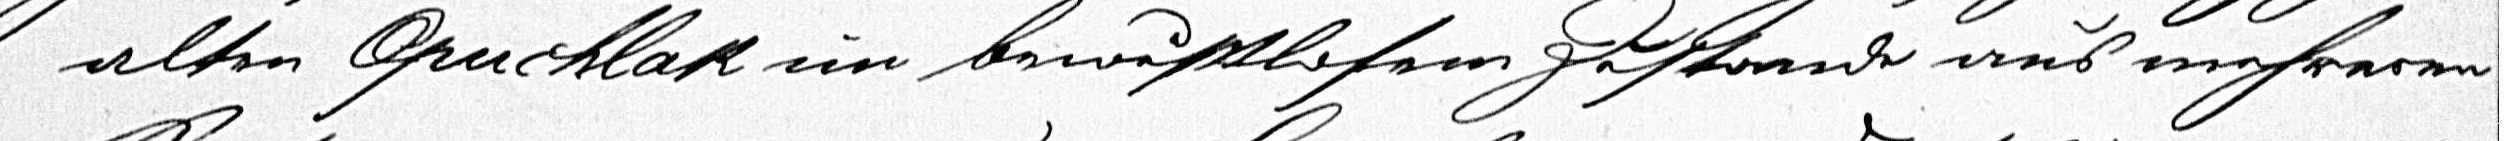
alten Opuchlak i bewustlosen Zustande aus mehreren
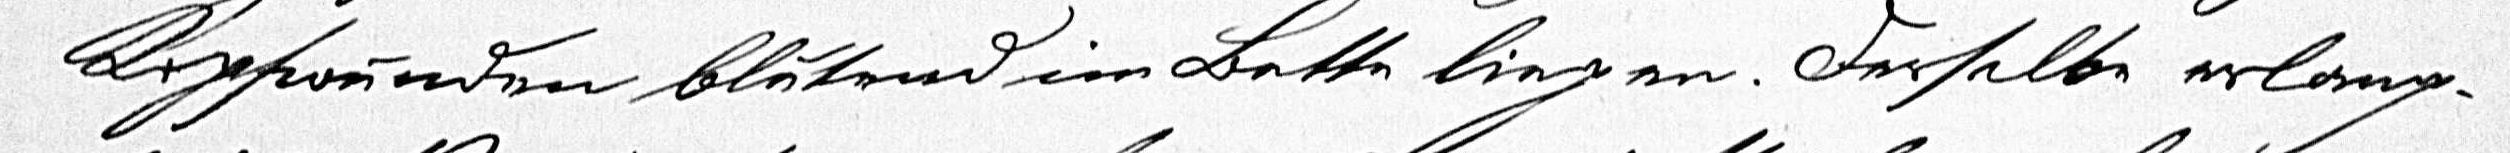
Kopfwunden blutend in Bette liegen. Derselbe erlang¬
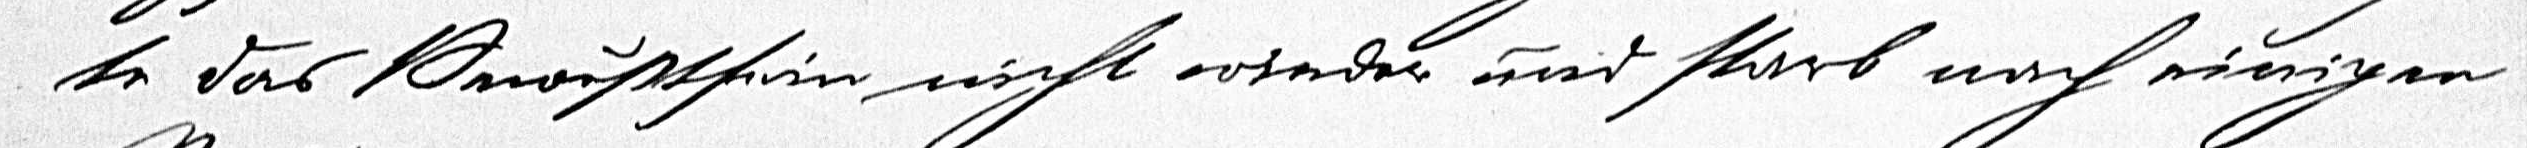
te das Bewußtsein nicht wieder und starb nach einigen
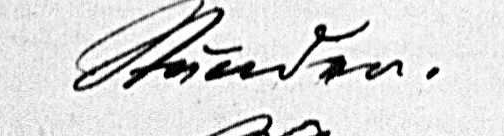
Stunden.
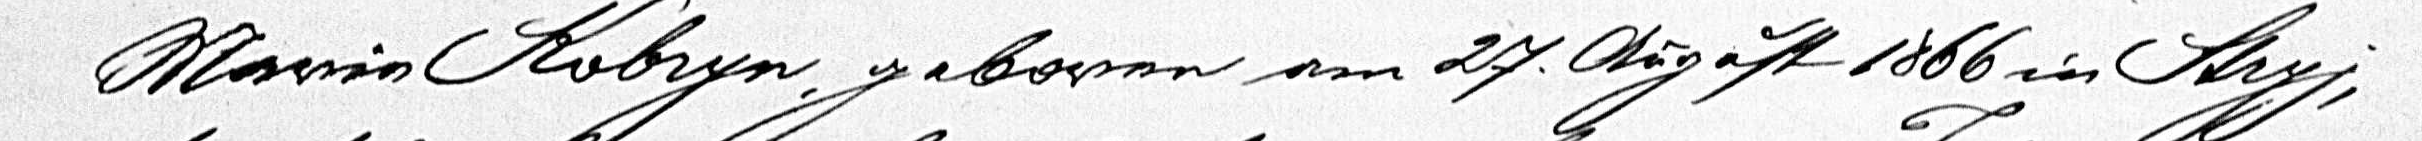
Marie Kobryn, geboren am 27. August 1866 in Stryj,
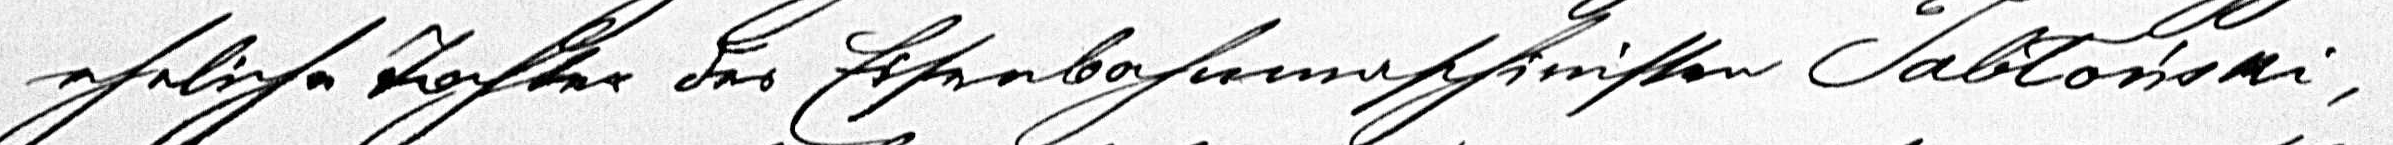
eheliche Tochter des Eisenbahnmaschinisten Jabłoński,
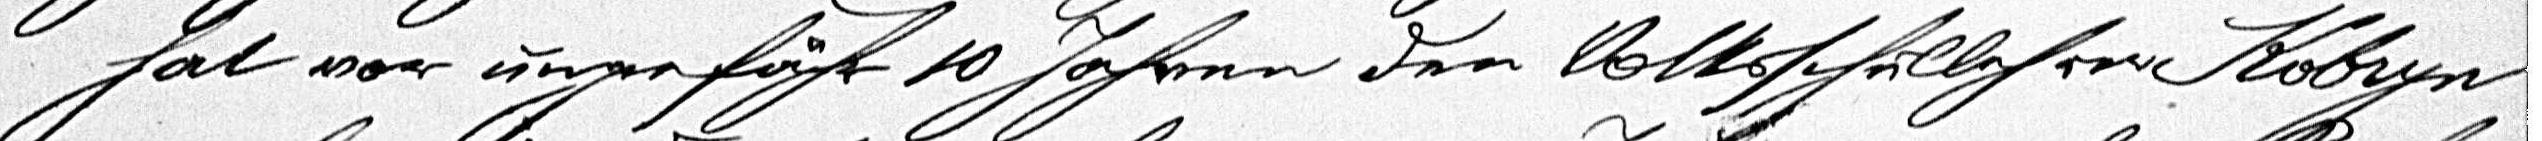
hat vor ungefähr 10 Jahren den Volksschullehrer Kobryn
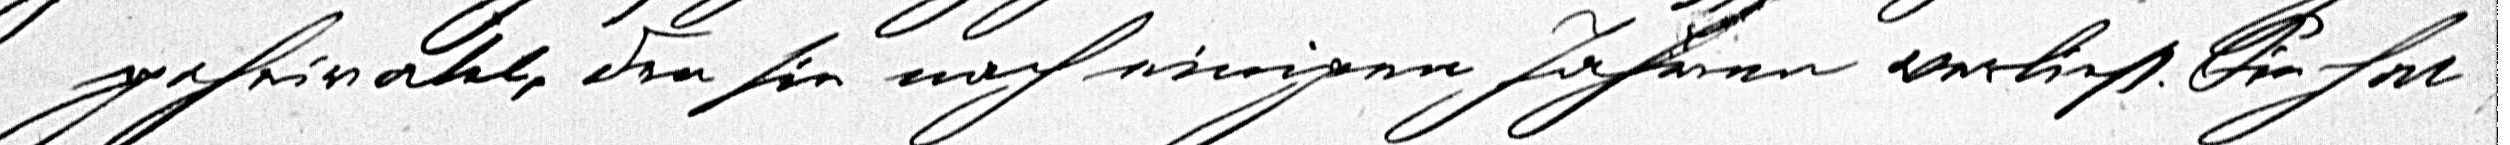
geheiratet, den sie nach einigen Jahren verließ. Sie hat
